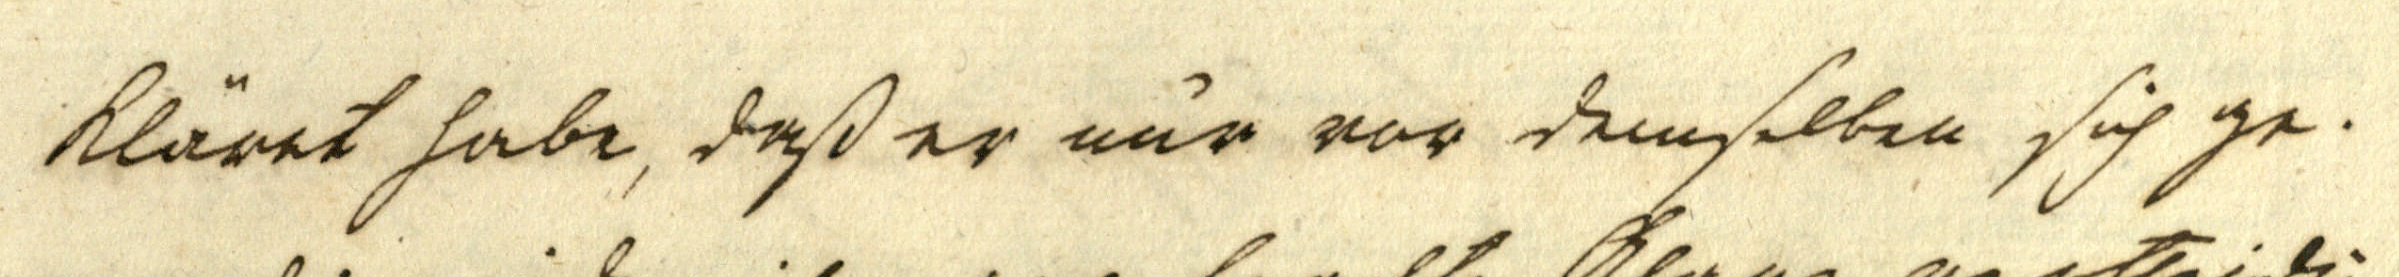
kläret habe, daß er nur vor demselben sich ge¬
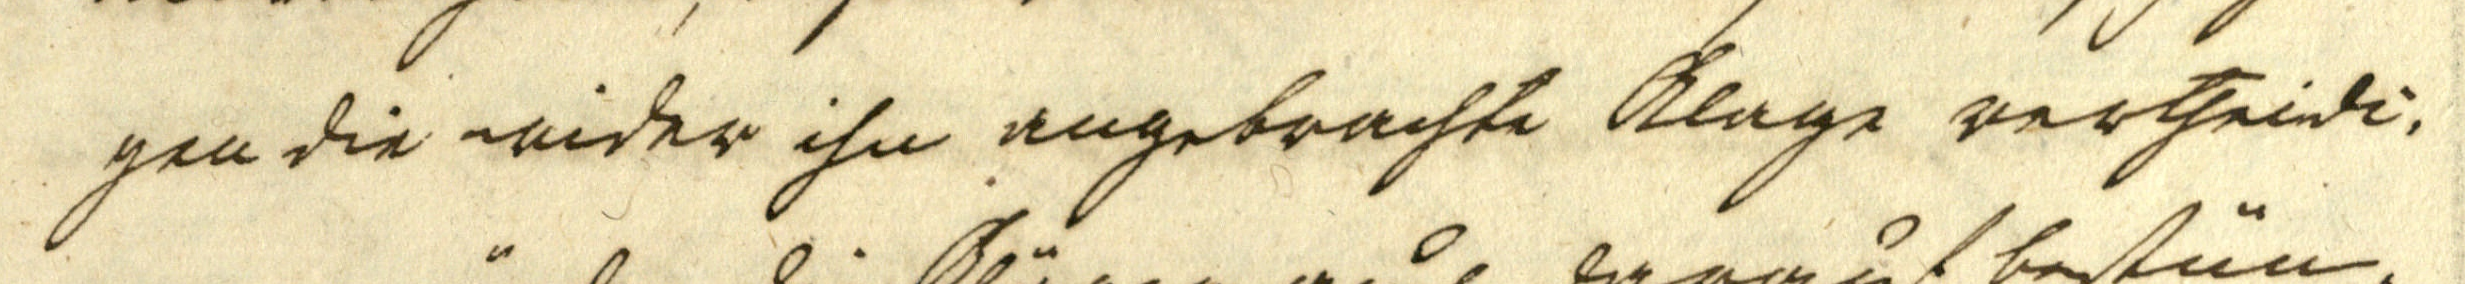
gen die wider ihn angebrachte Klage vertheidi¬
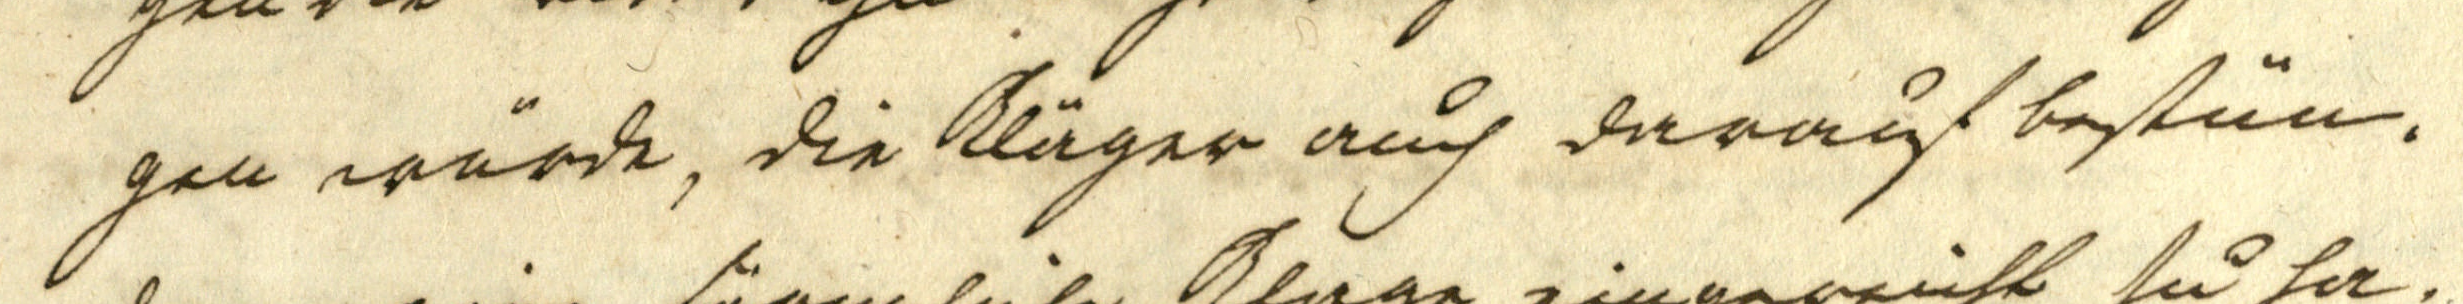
gen würde, die Klagen auch darauf bestün¬
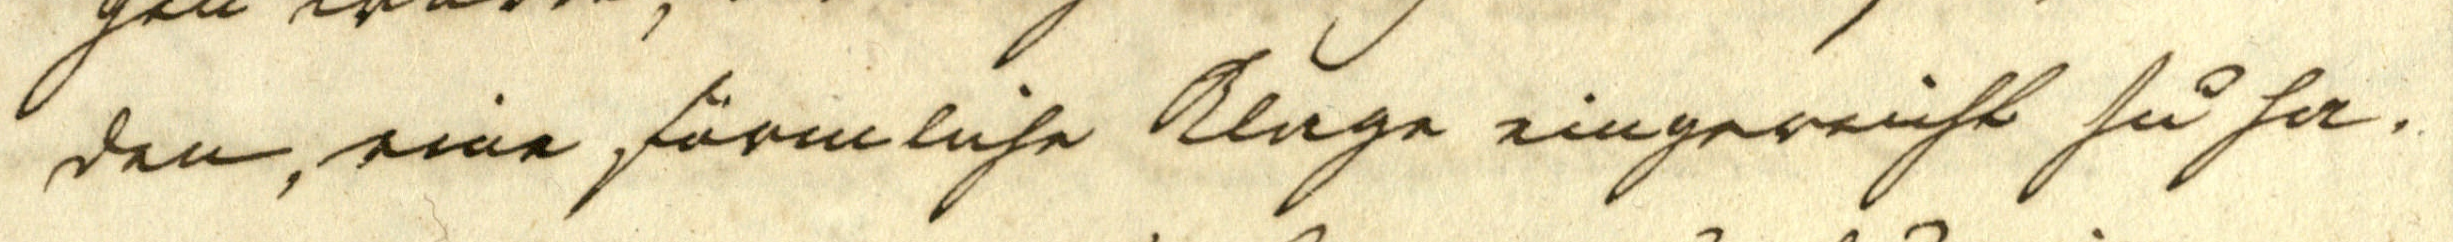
den, eine förmliche Klage eingereicht zu ha¬
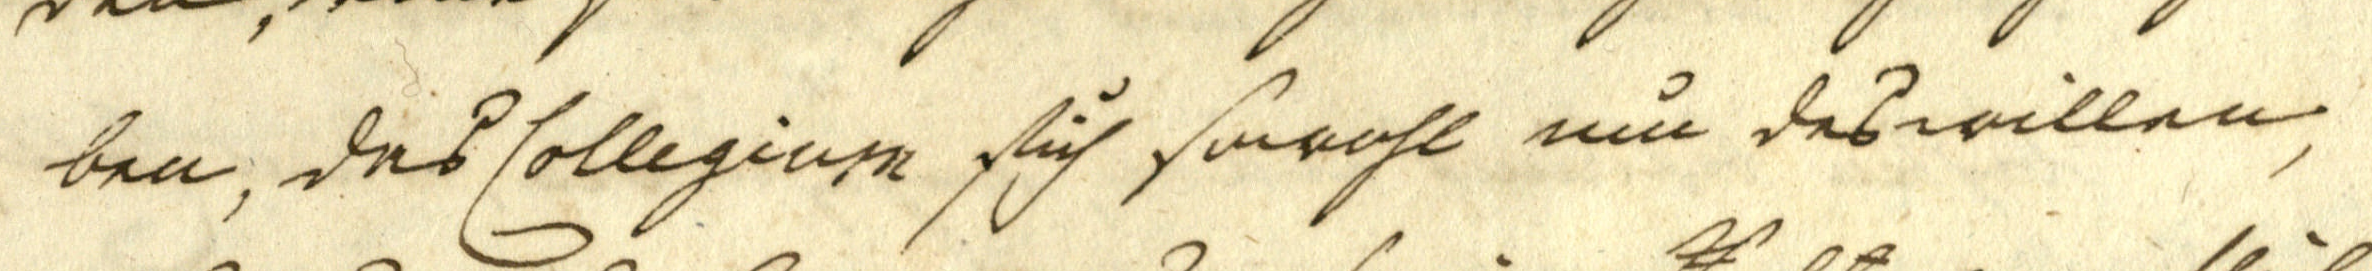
ben, das Collegium sich sowohl um deswillen,
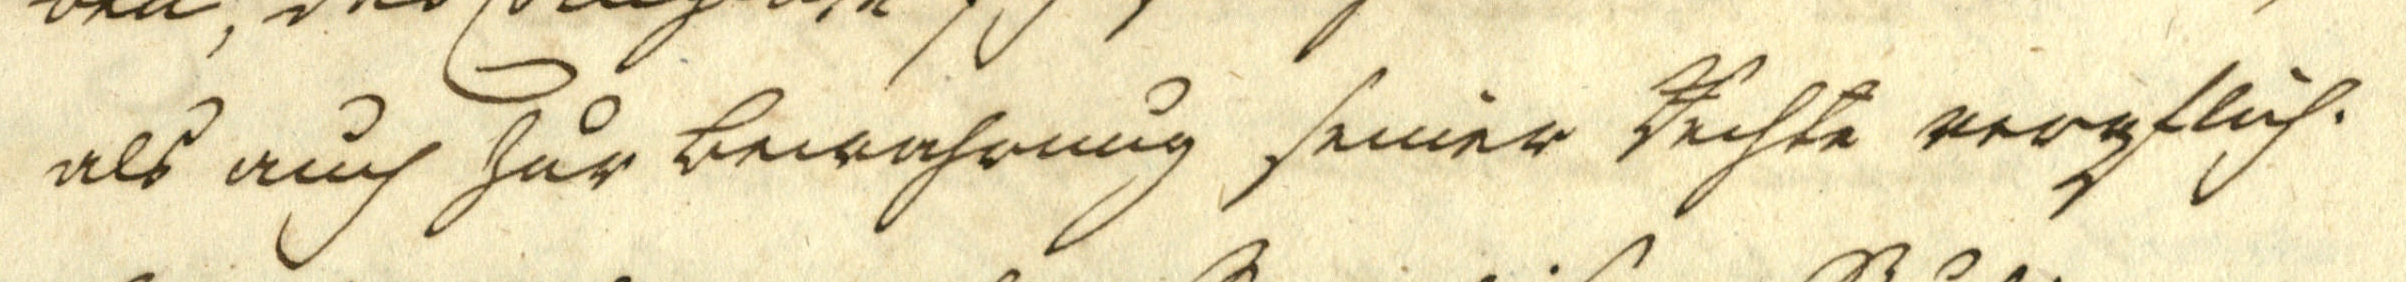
als auf zur Bewahrung seiner Rechte verpflich¬
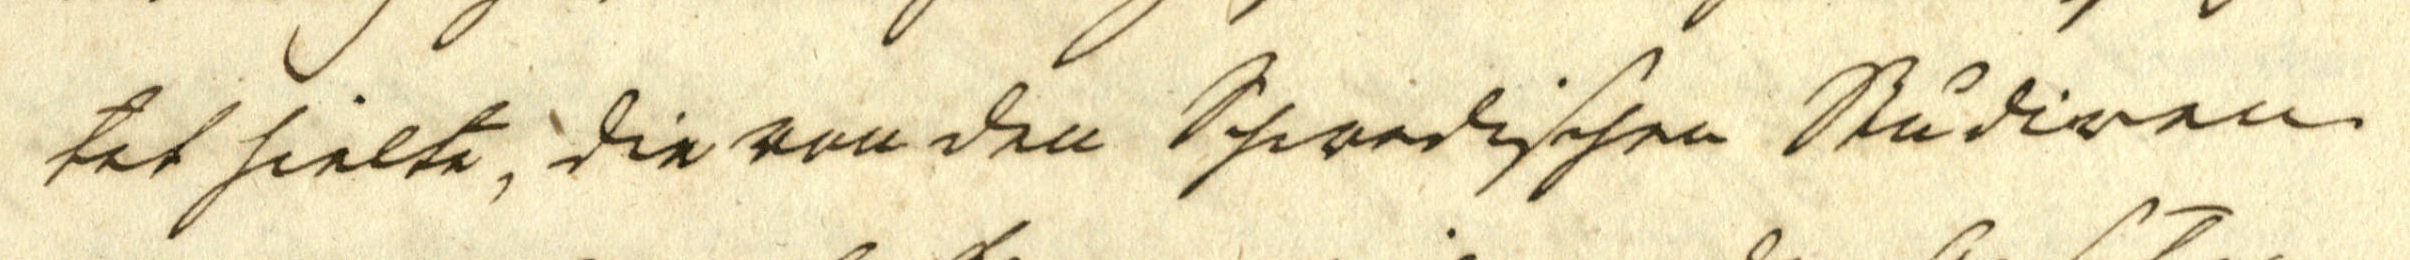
tet hielte, die von den Schwedischen Studiren¬
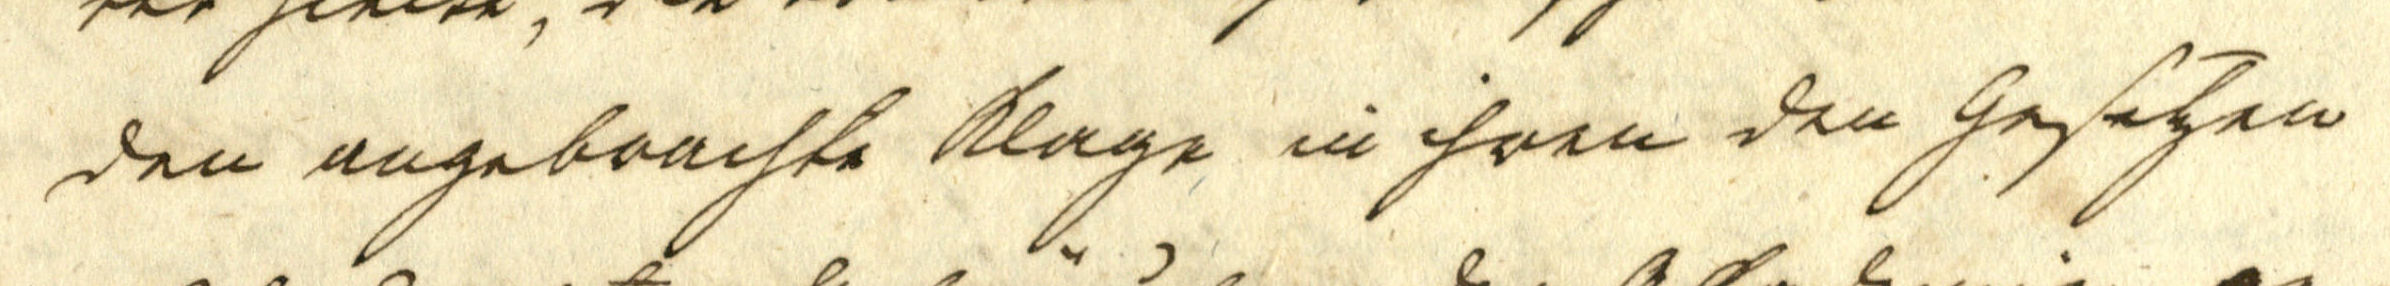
den angebrachte Klage in ihren den Gesetzen
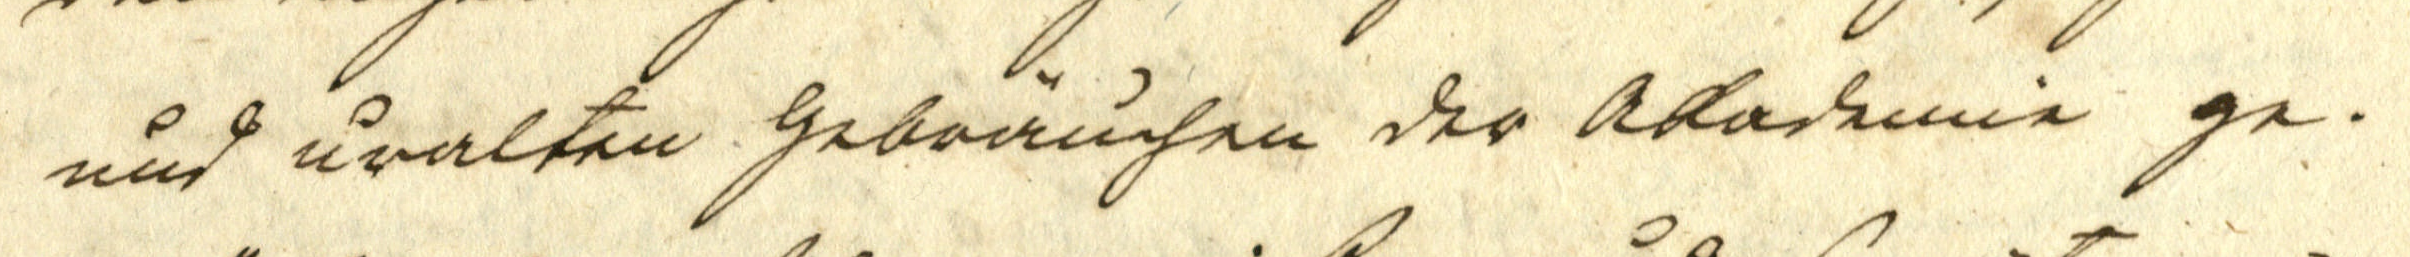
und uralten Gebräuchen der Akademie ge¬
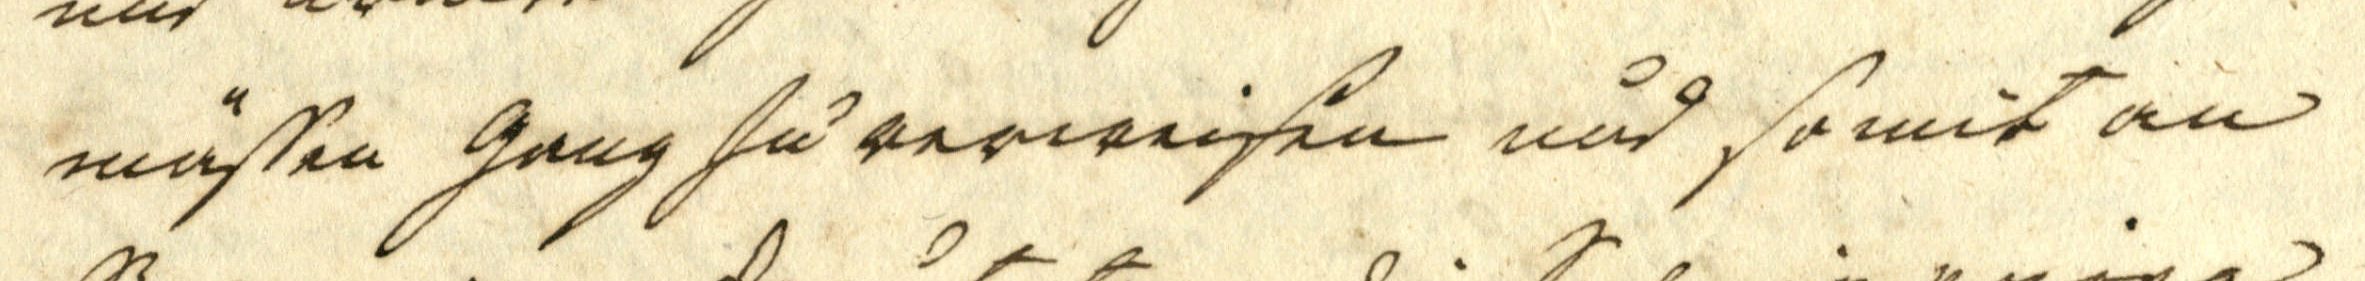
mässen Gang zu verweisen und somit an
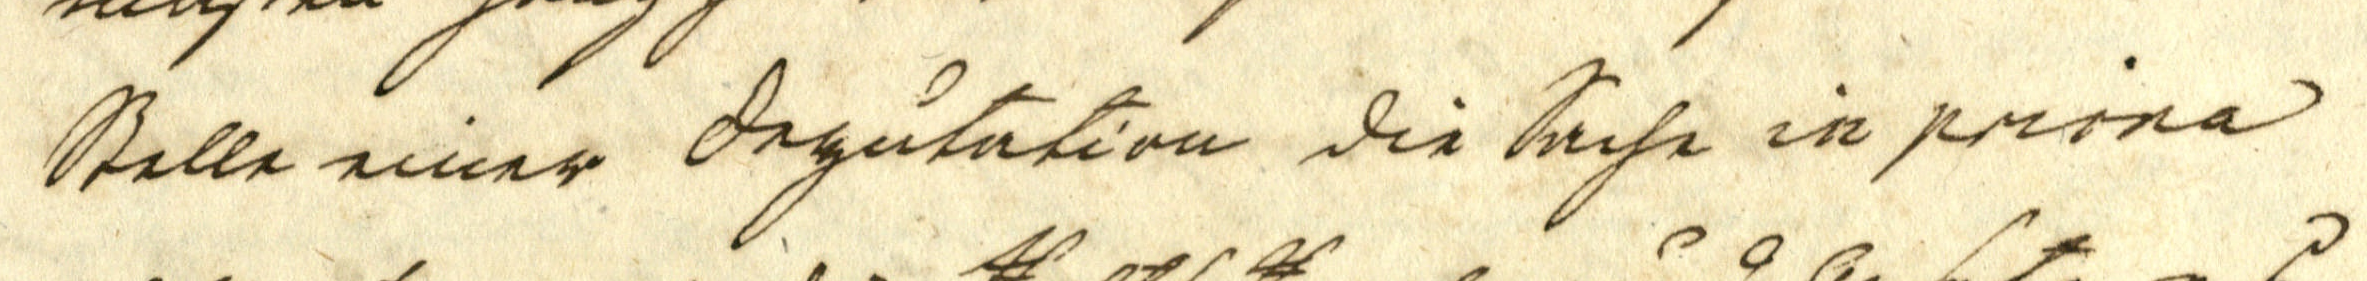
Stelle einer Deputation die Sache in prima
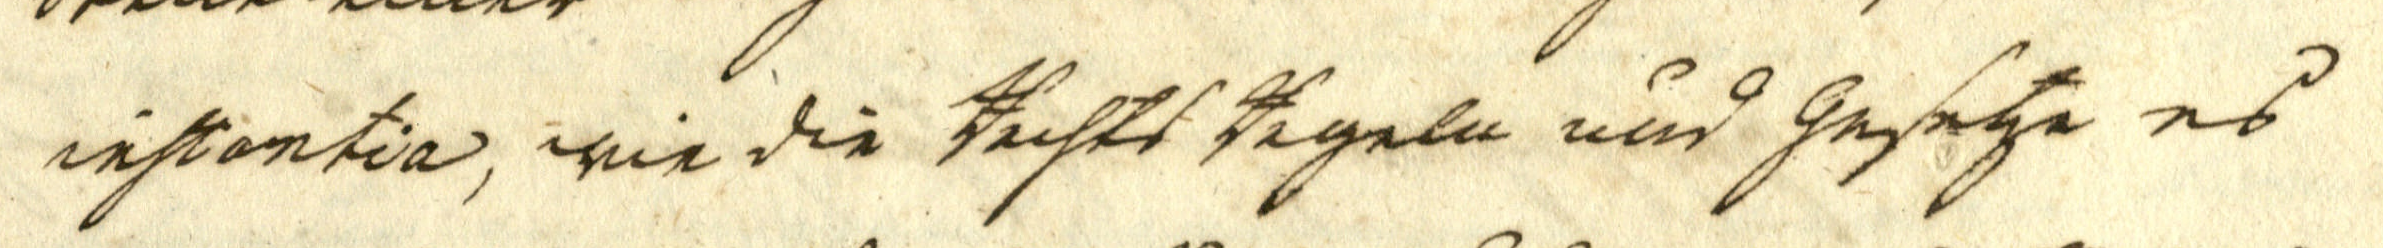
instantia, wie die Rechts Regeln und Gesetze es
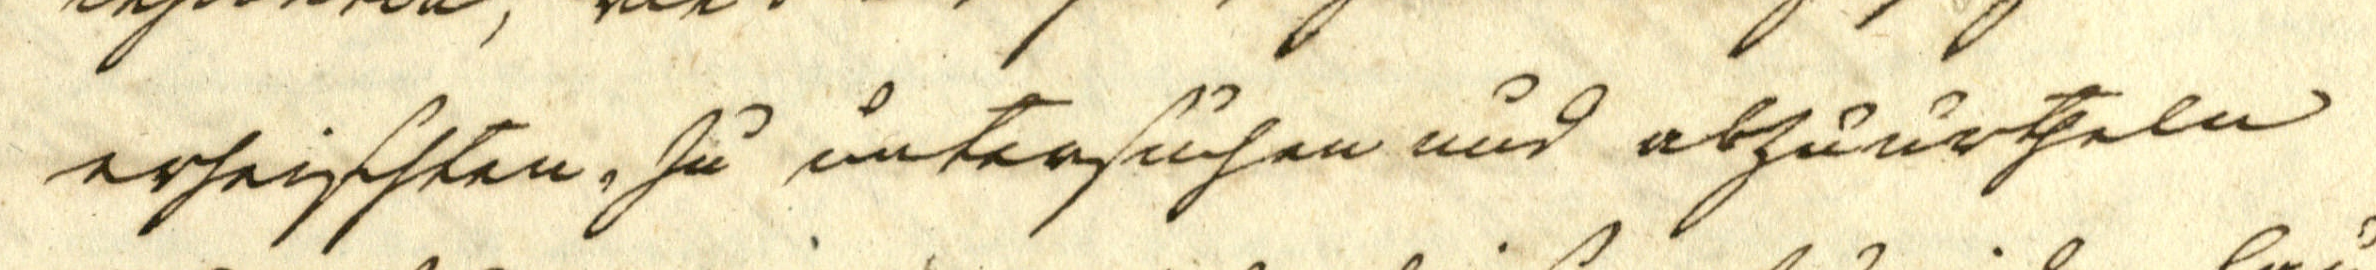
erheischten, zu untersuchen und abzuurtheln
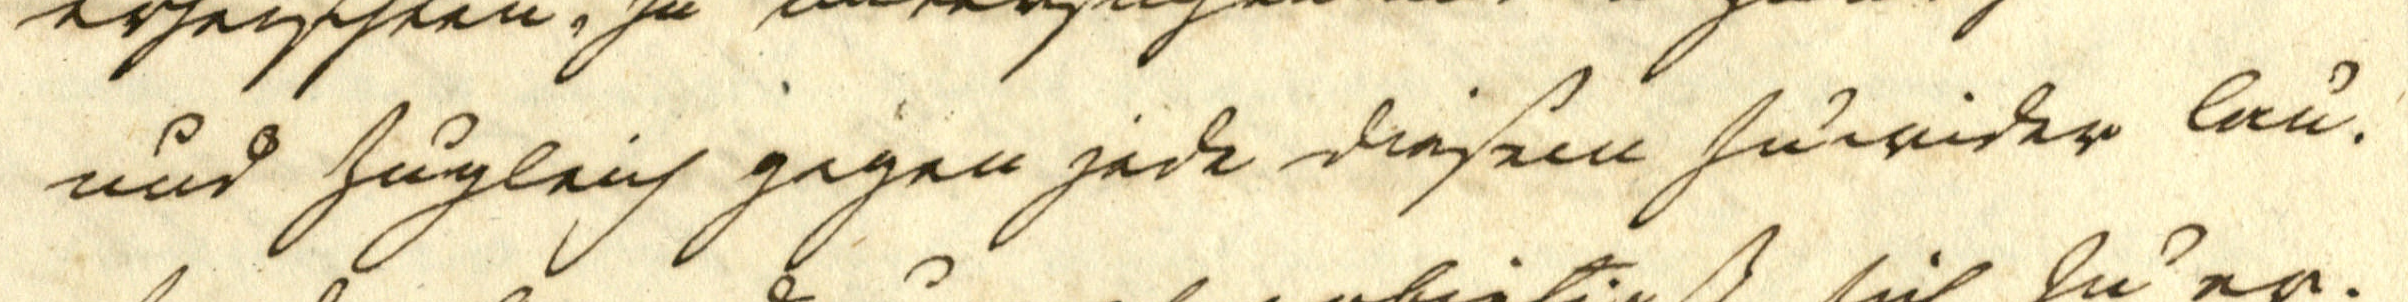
und zugleich gegen jede diesem zuwider lau¬
